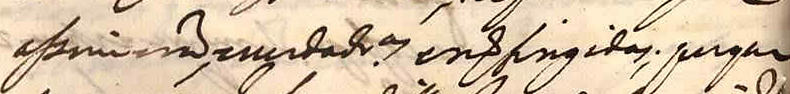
assim eraõ, e uerdadr.as e não fingidas; porque
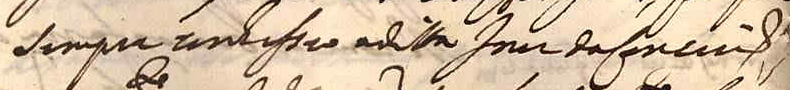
sempre conhesseo a ditta Jnes da Conceiçaõ
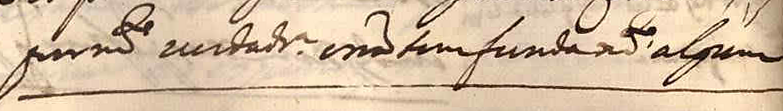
por mto uerdadr.a, e naõ tem fundam.to algum
